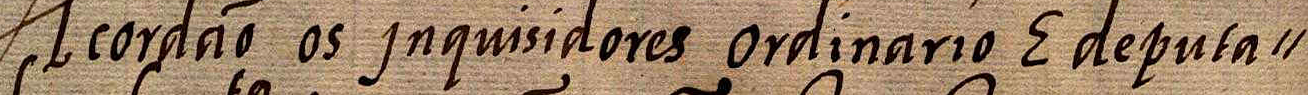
Acordaõ os jnquisidores ordinario E deputa
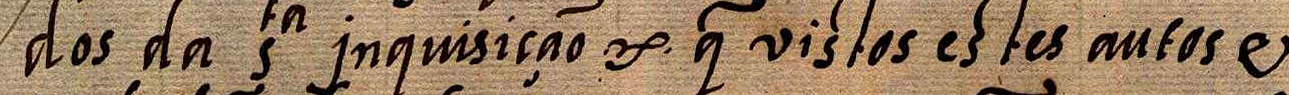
dos da sta jnquisiçaõ cꝭ. q̄ vistos estes autos e
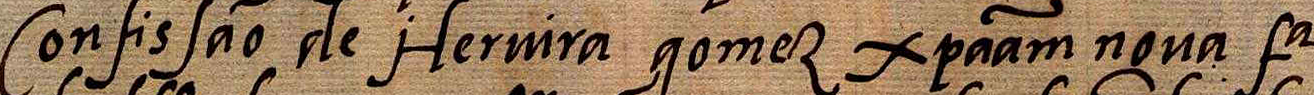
Confissaõ de Heruira gomez Xpaãm noua fa
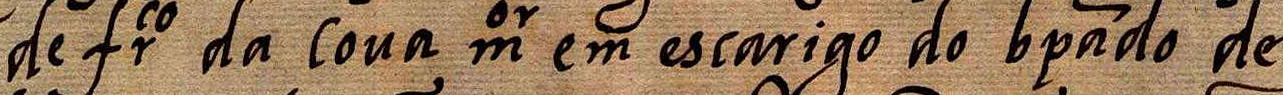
de frco da Coua mor em escarigo do bpādo de
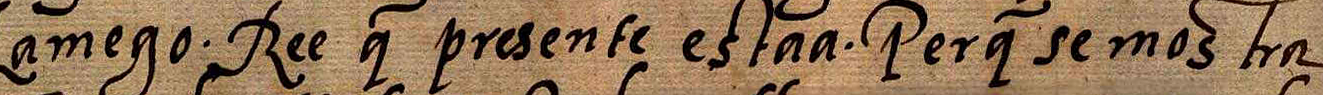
Lamego. Ree q̄ presente estaa. Per q̄ se mostra
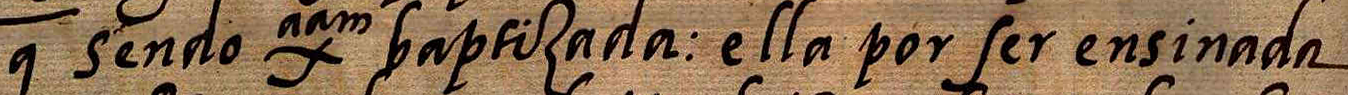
q̄ sendo xaam baptizada: ella por ser ensinada
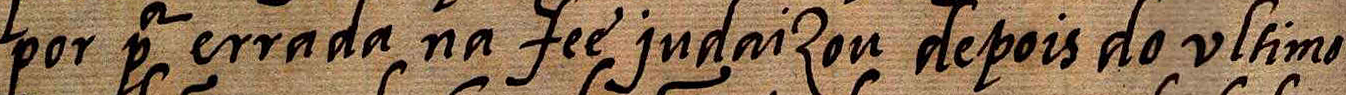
por pa errada na feé judaizou depois do vltimo
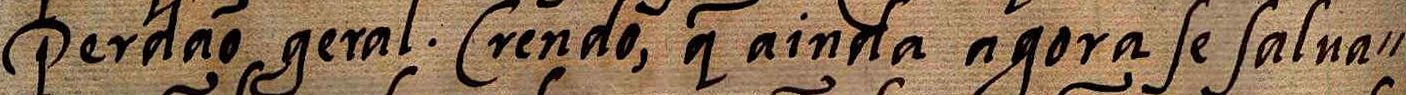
Perdaõ geral. Crendo, q̄ ainda agora se salua
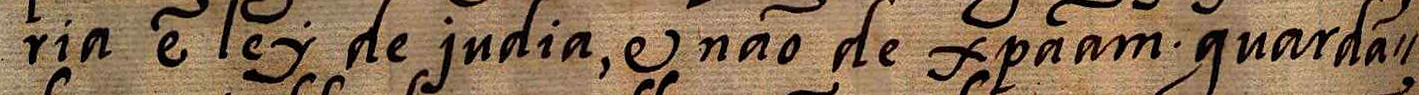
ria ē ley de judia, e naõ de xpaām. guardā
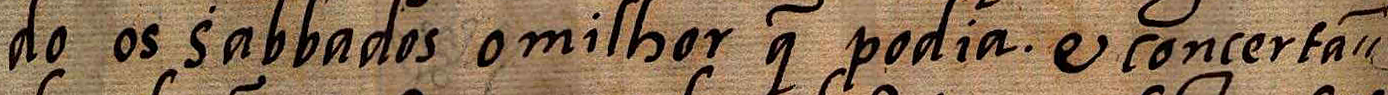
do os sabbados o milhor q̄ podia. e concertā
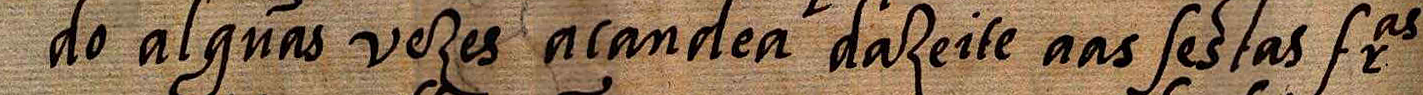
do algūas vezes a candea dazeite aas sestas fras
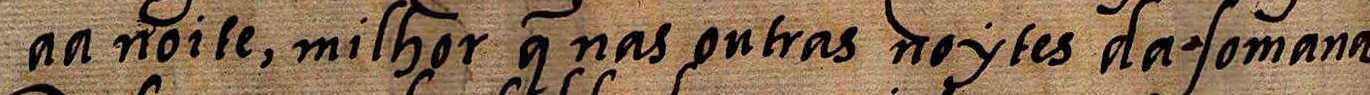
aa noite, milhor q̄ nas outras noytes da somana
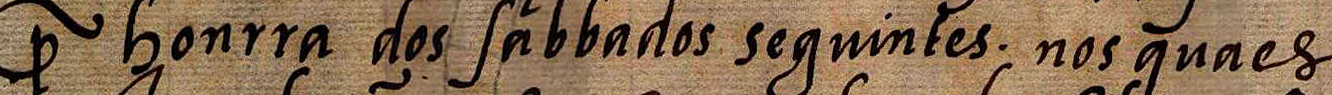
p̄o honrra dos sabbados seguintes. nos quaes
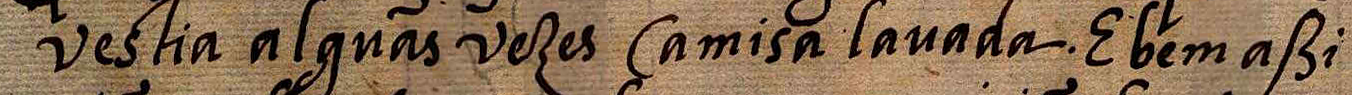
vestia alguās vezes Camisa lauada. E bem assi
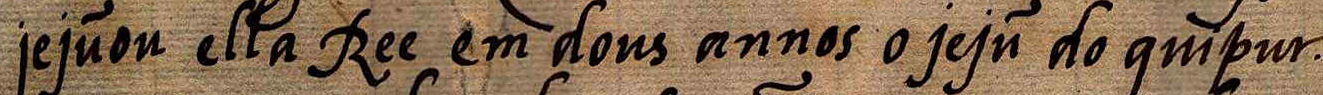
jejūou ella Ree em dous annos o jejū do quipur
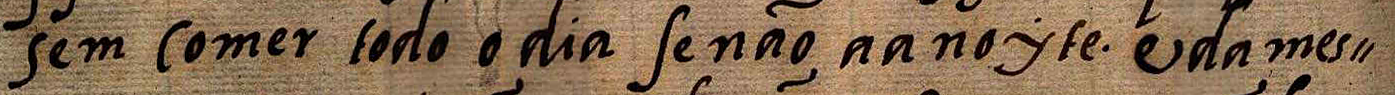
sem comer todo o dia senão aa noyte. e da mes
